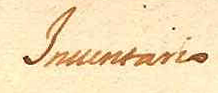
Inuentario
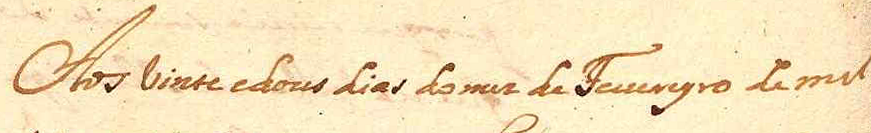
Aos vinte e dous dias do mez de Feuereyro de mil
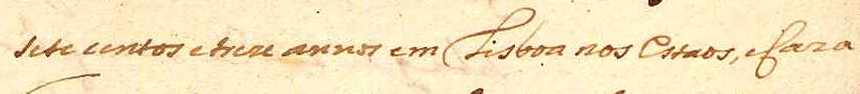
setecentos e treze annos em Lisboa nos Estaos, e Caza
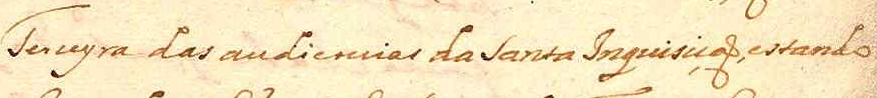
Terceyra das audiencias da Santa Inquisiçaõ, estando
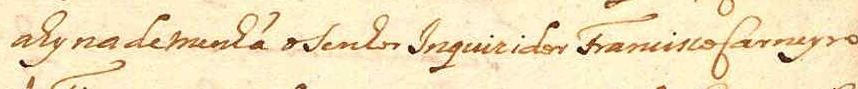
ahy na de menhã o Senhor Inquizidor Francisco Carneyro
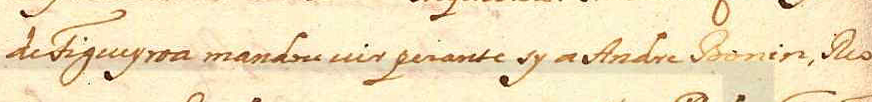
de Figueyroa mandou uir perante sy a Andre Bonin, Reo
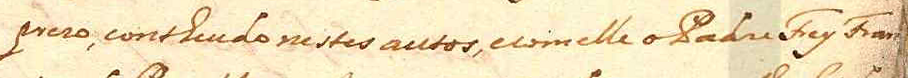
prezo, contheudo nestes autos, e com elle o Padre Frey Fran
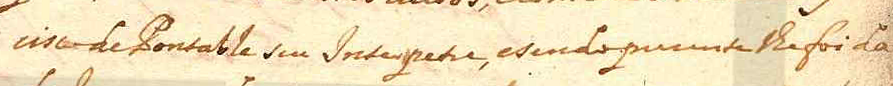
cisco de Pontable seu Interpetre, e sendo prezente lhe foi da
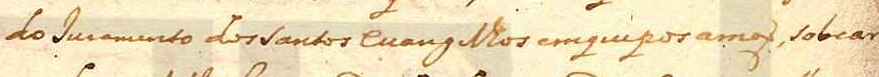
do Iuramento dos santos euangelhos em que pos a maõ, sob car
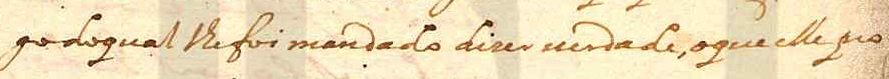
go do qual lhe foi mandado dizer uerdade, o que elle pro
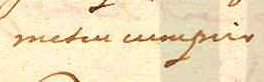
meteu cumprir.
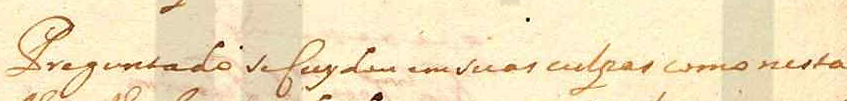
Preguntado se Cuydou em suas culpas como nesta
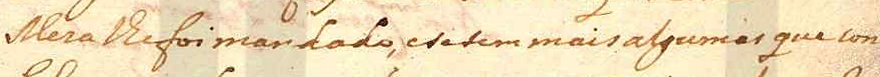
Meza lhe foi mandado, e se tem mais algumas que con
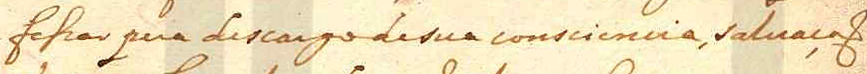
fessar pera descargo de sua consciencia, saluaçaõ
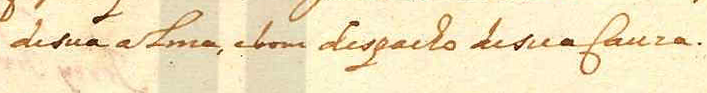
de sua alma, e bom despacho de sua Cauza.
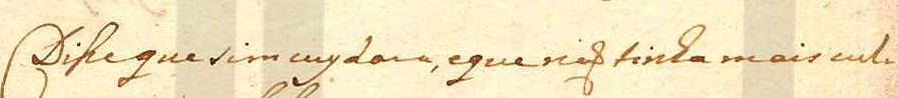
Disse que sim cuydara, e que naõ tinha mais cul
